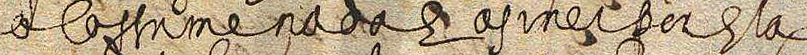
do Costume nada E asinei por Ela
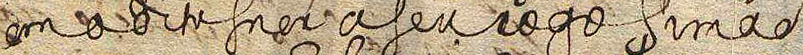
com o dito snor̄ a seu rogo Simaõ
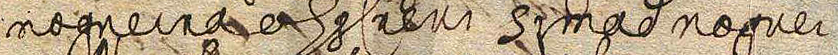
nogueira o EsCreui Simaõ noguei
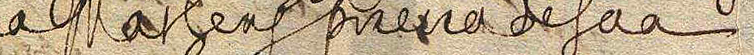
ra Matheus pireira de saa
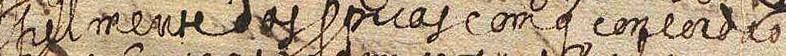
fielmente das ꝓprias com q̄ concordaõ
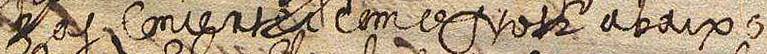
E as Concertei com o Notro abaixo
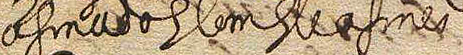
asinado E Com Ele asinei
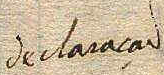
declaraçaõ
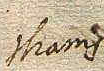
thanis
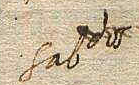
sabdos
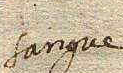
sangue
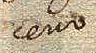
ceuo
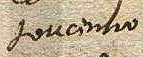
toucinho
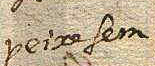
peixe sem
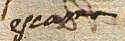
escama.
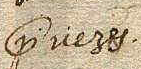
ꝓ uezes.
